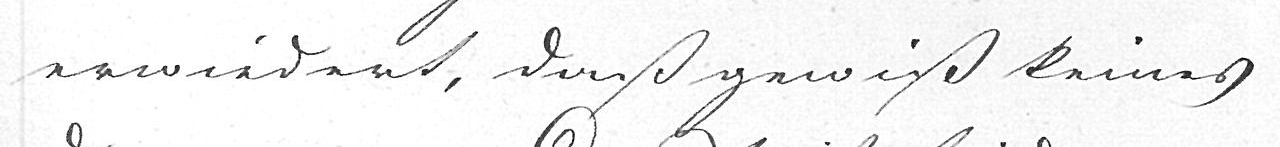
erwidert, daß gewiß keines
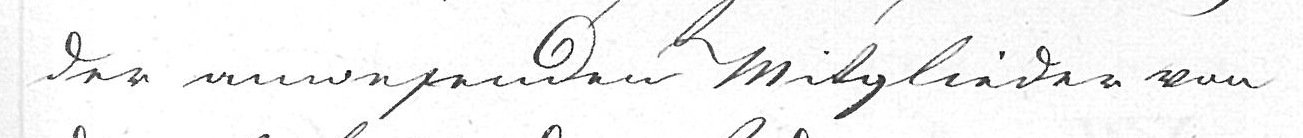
der anwesenden Mitglieder von
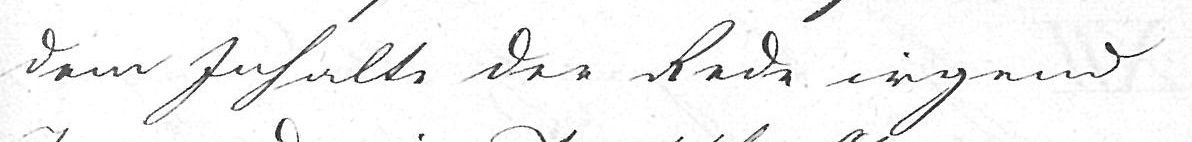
dem Inhalte der Rede irgend
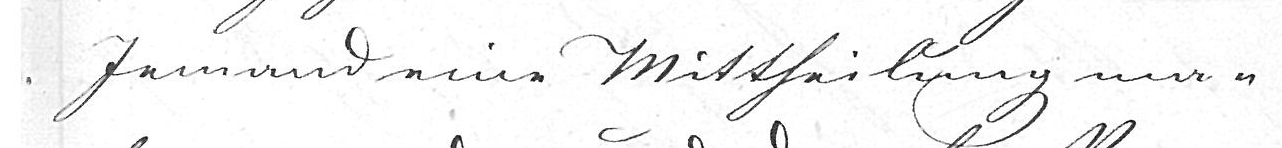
Jemand eine Mittheilung ma-
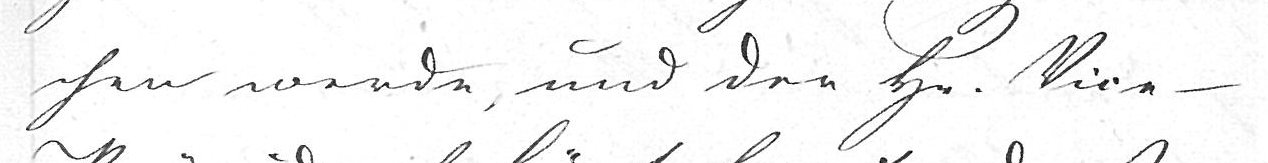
chen werde, und der Hr. Vice-
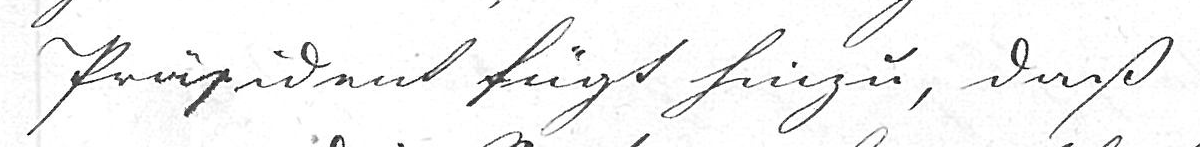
Präsident fügt hinzu, daß
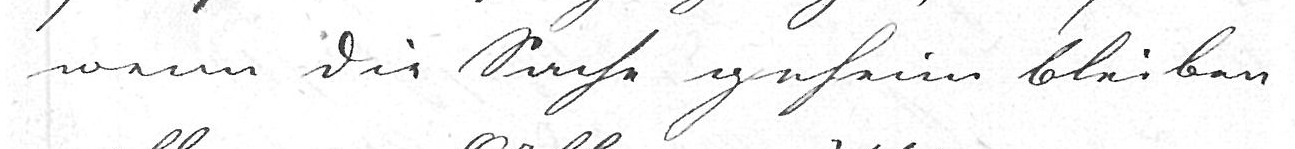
wenn die Sache geheim bleiben
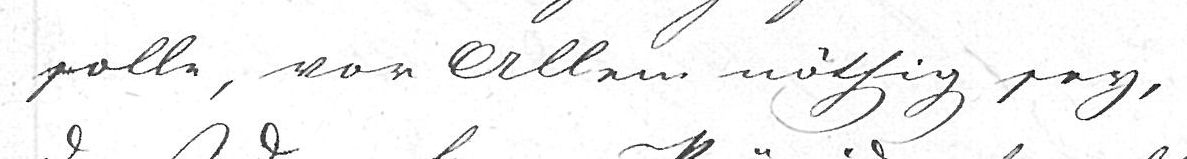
solle, vor Allem nöthig sey,
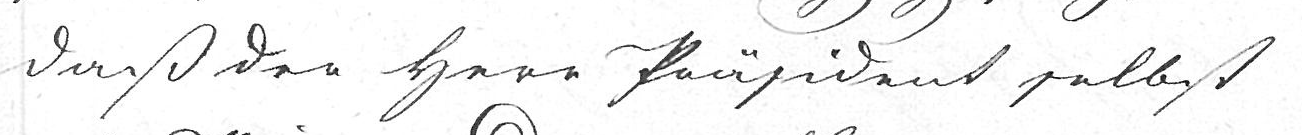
daß der Herr Präsident selbst
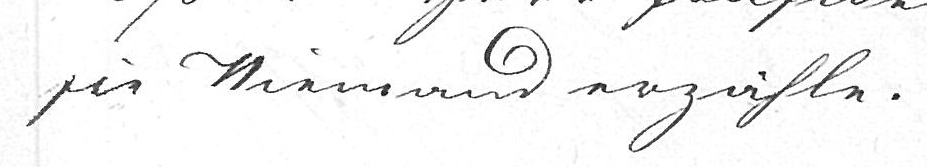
sie Niemand erzähle.
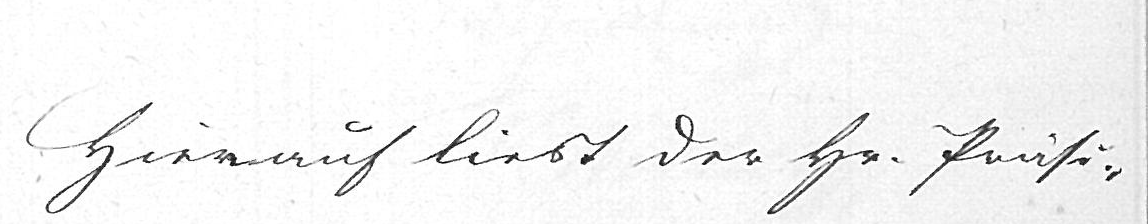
Hierauf liest der Hr. Präsi-
